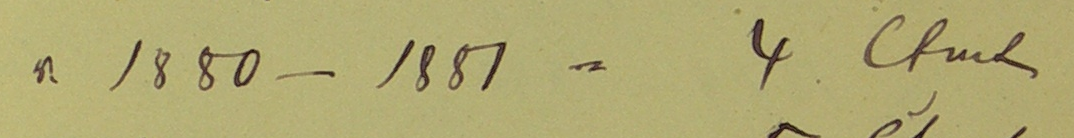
1880-1881 = 4 ctmtr
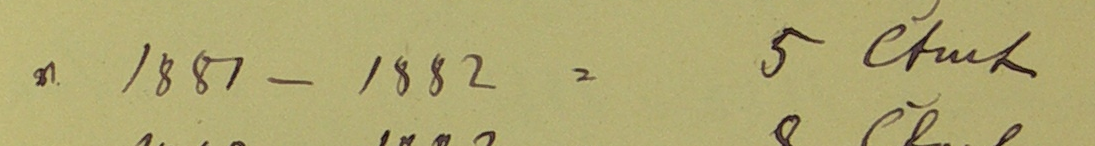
1881-1882 = 5 ctmtr
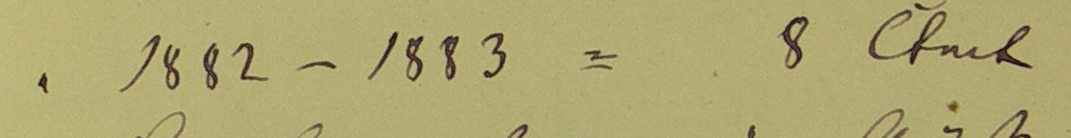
1882-1883 = 8 ctmtr
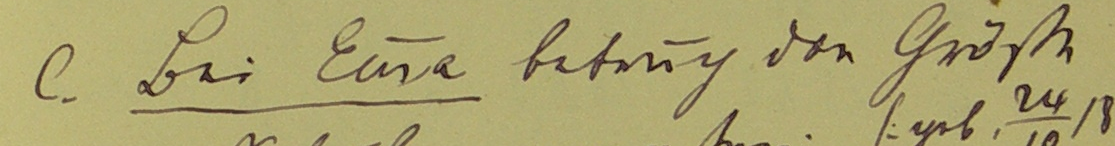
C) Bei Emma betrug die Größe
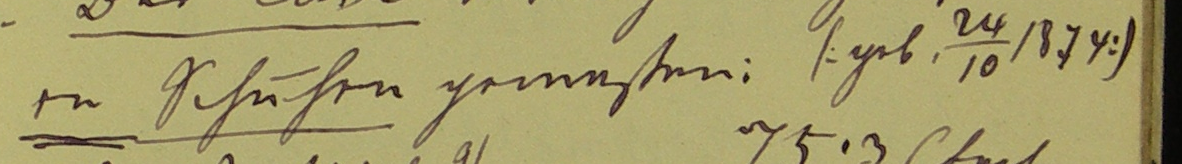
in Schuhen gemeßen. (: Geb. 24/10 1874 :)
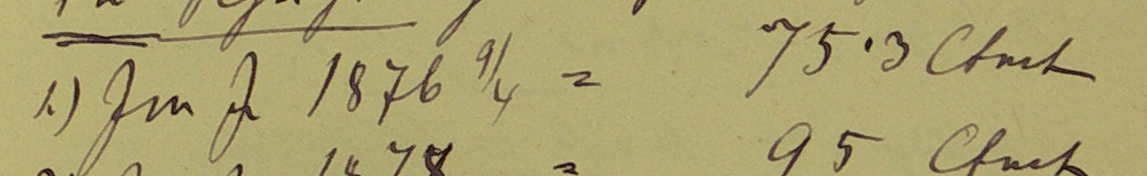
1) Im Jahre 1876 9/4 = 75,3 ctmtr
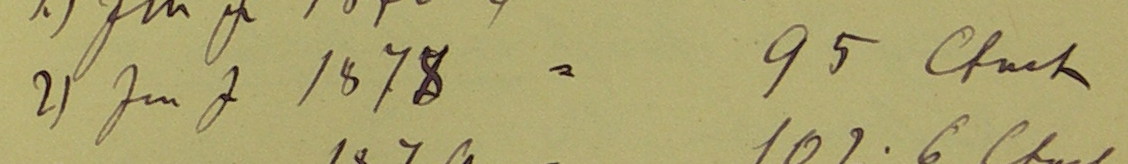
2) 1878 = 95 ctmtr
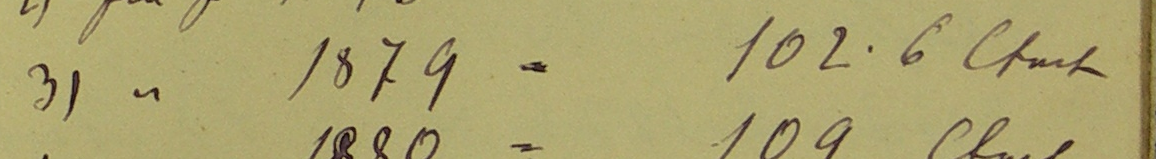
3) 1879 = 102 ctmtr
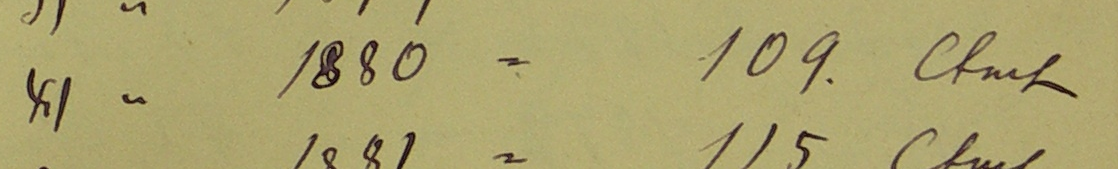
4) 1880 = 109 ctmtr
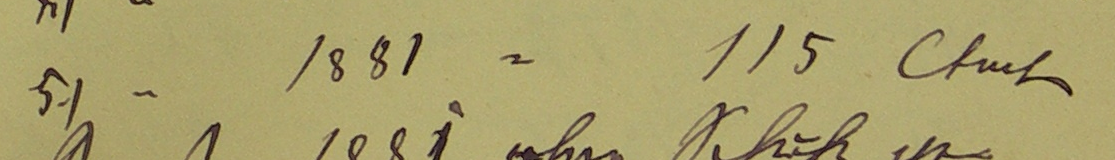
5) 1881 = 115 cmtr
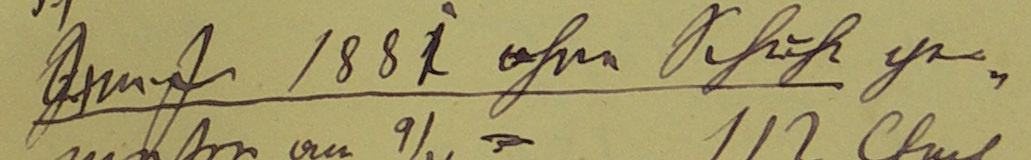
Im Jahre 1881 ohne Schuh ge¬
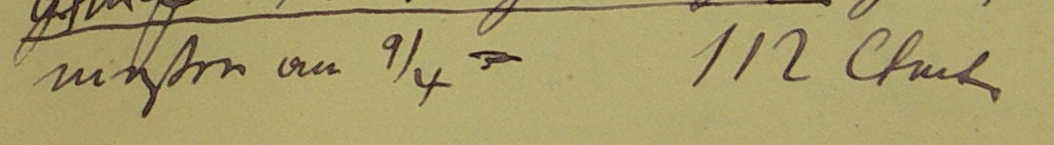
meßen am 9/4 = 112 cmtr
